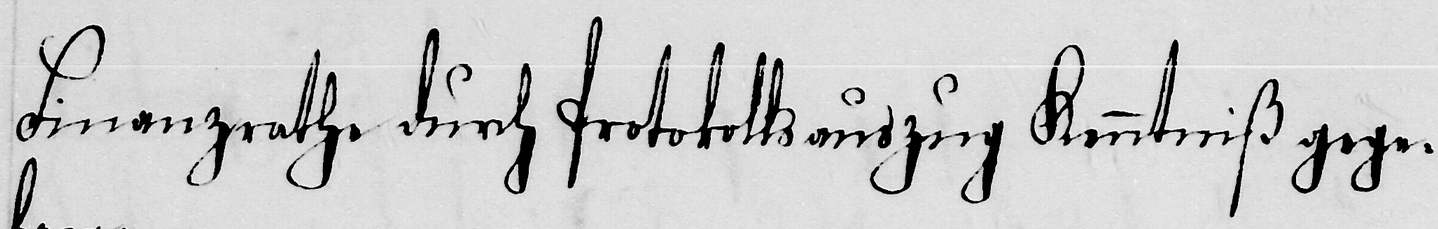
Finanzrathe durch Protokollsauszug Kenntniß gege¬
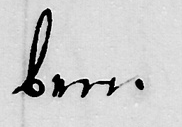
ben.
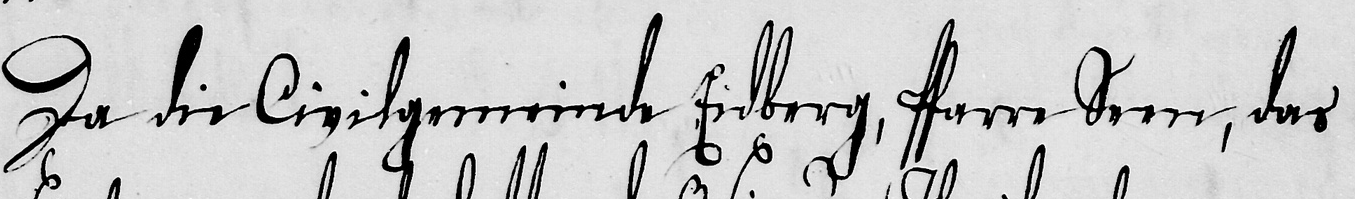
Da die Civilgemeinde Eidberg, Pfarre Seen, das
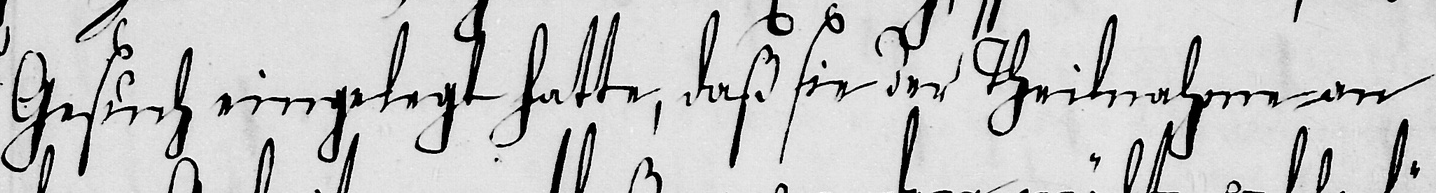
Gesuch eingelegt hatte, daß sie der Theilnahme an
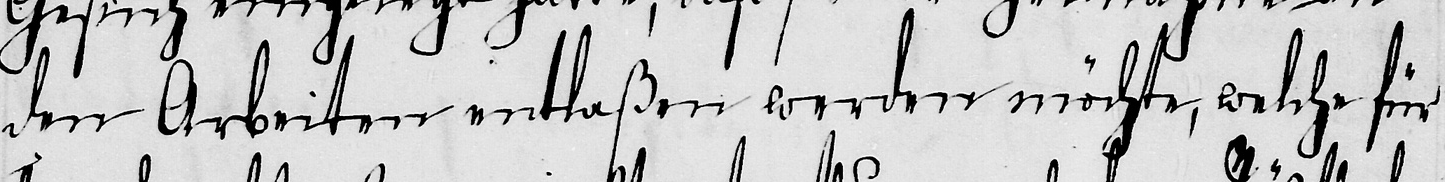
den Arbeiten entlaßen werden möchte, welche für
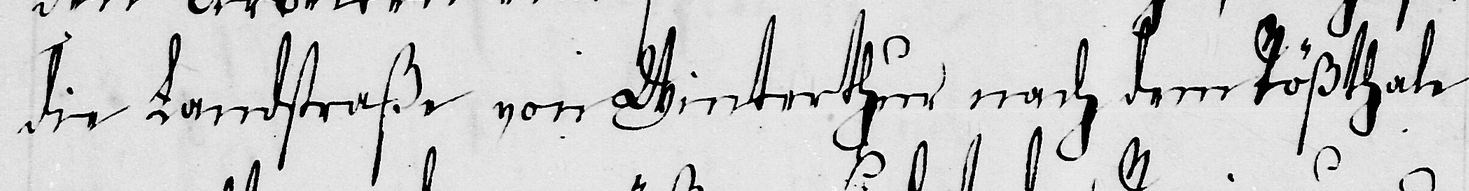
die Landstraße von Winterthur nach dem Tößthale
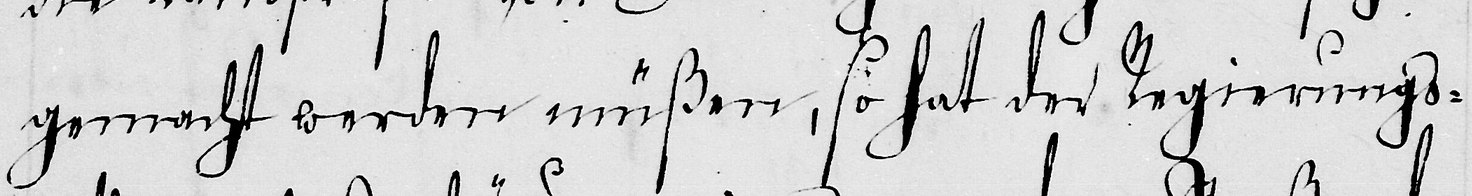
gemacht werden müßen, so hat der Regierungs¬
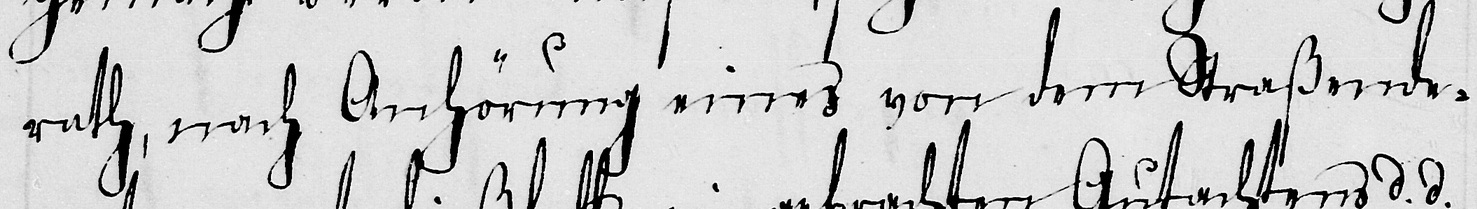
rath, nach Anhörung eines von dem Straßende¬
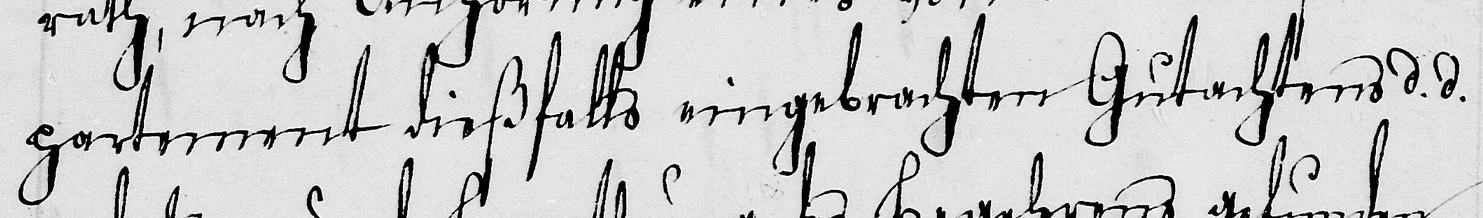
partement dießfalls eingebrachten Gutachtens d.d.
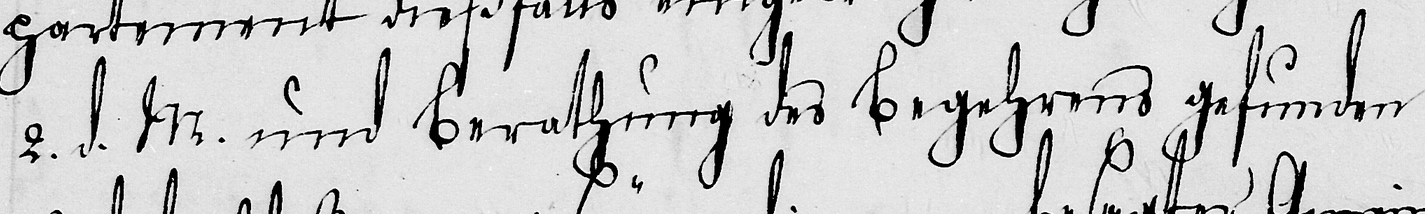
2. d. M. und Berathung des Begehrens gefunden
